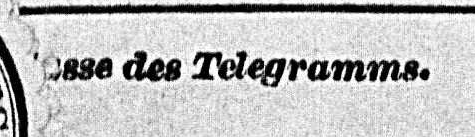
xx des Telegramms.
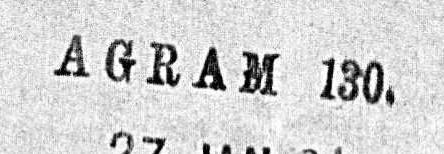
Agram 130.
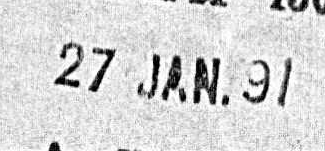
27 Jan. 91
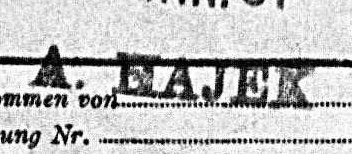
A. Hajek
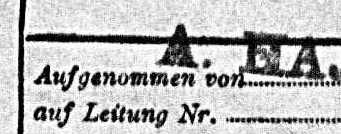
Aufgenommen von..........................................................................
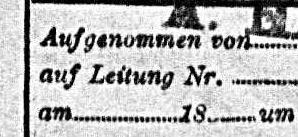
auf Leitung Nr..................................................................................
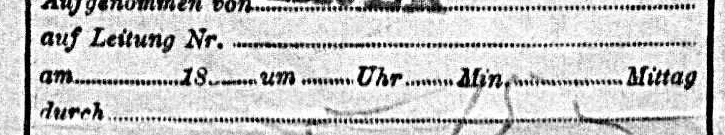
am...........18......um............Uhr..............Min........................ Mittag
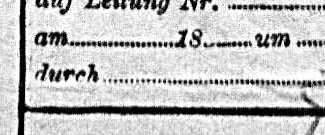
durch...................................................................................................
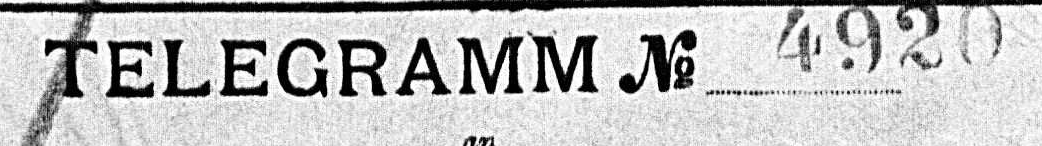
Telegramm No. 4920
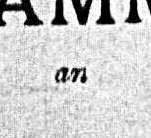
an
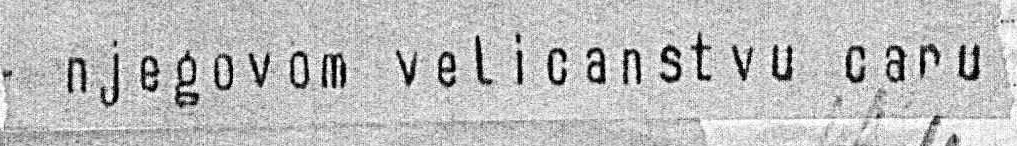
njegovom velicanstvu caru
